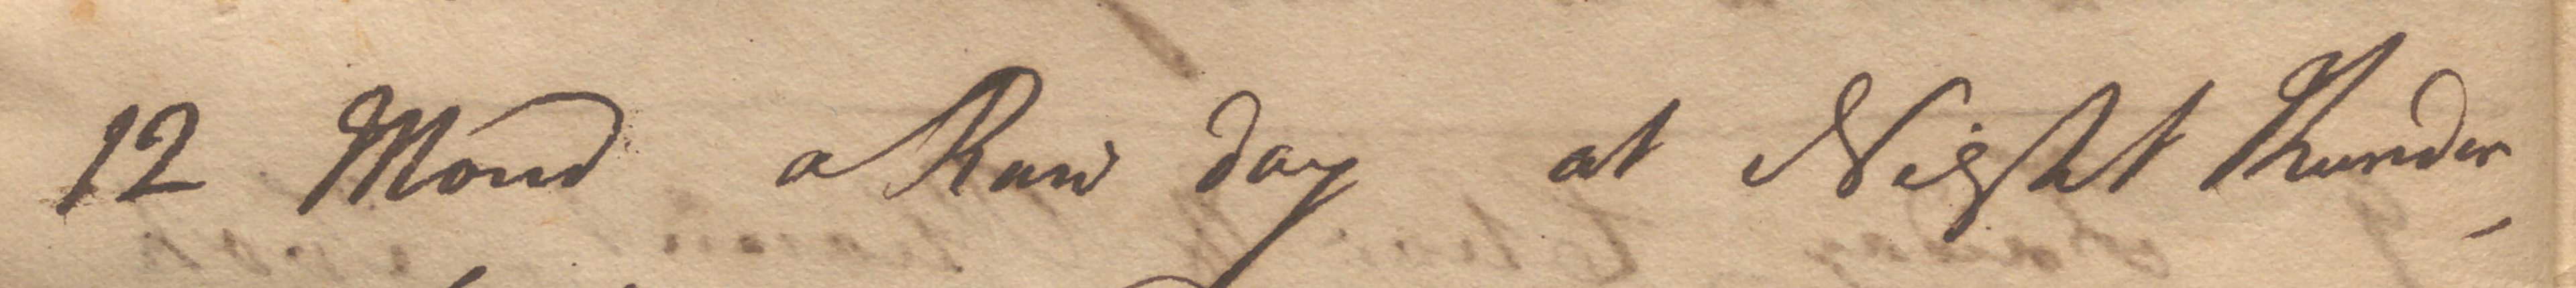12 Mond a Raw day at Night thunder
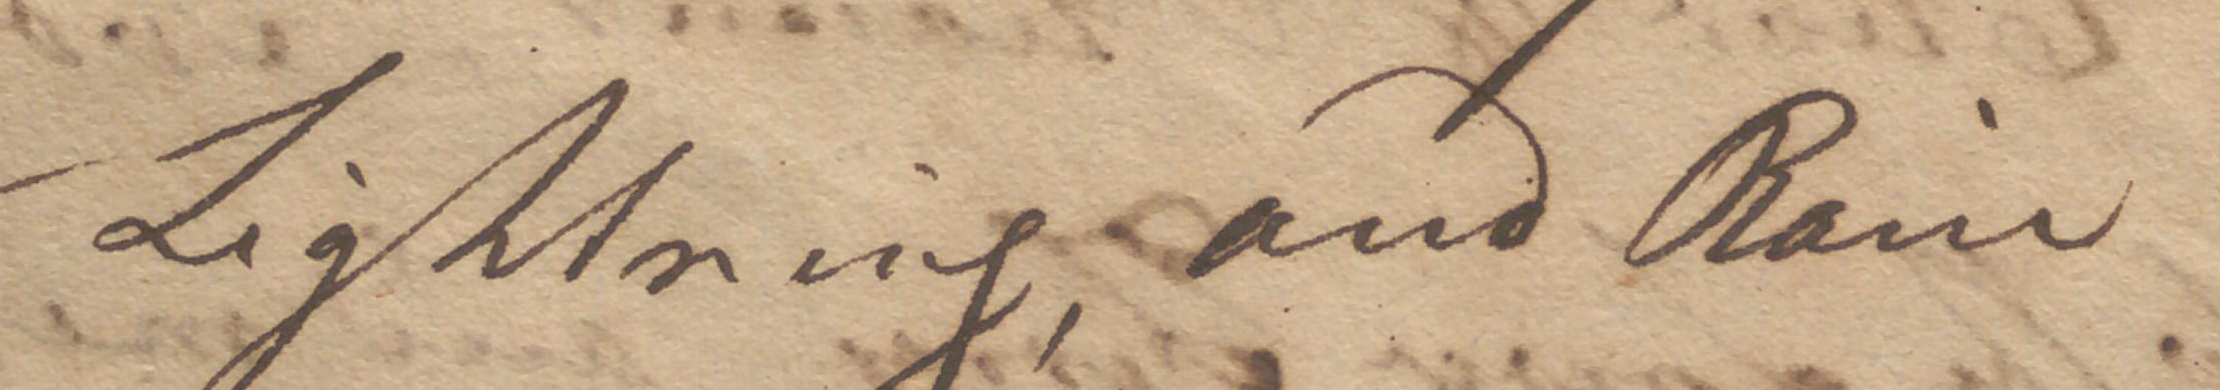Lightning, and Rain
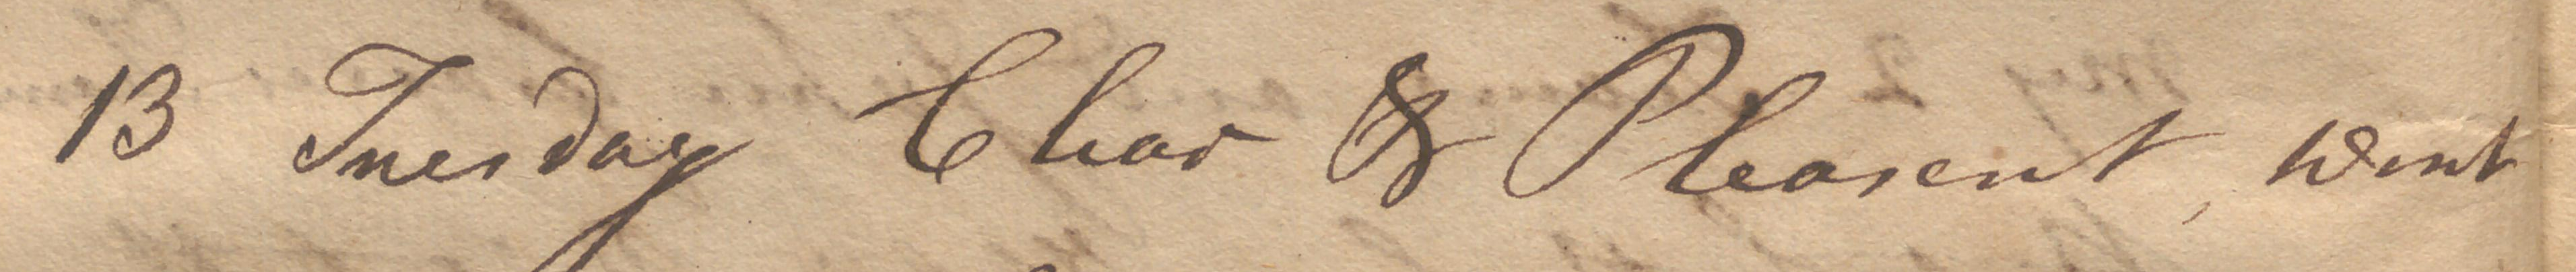13 Tuesday Clear & Pleasent went
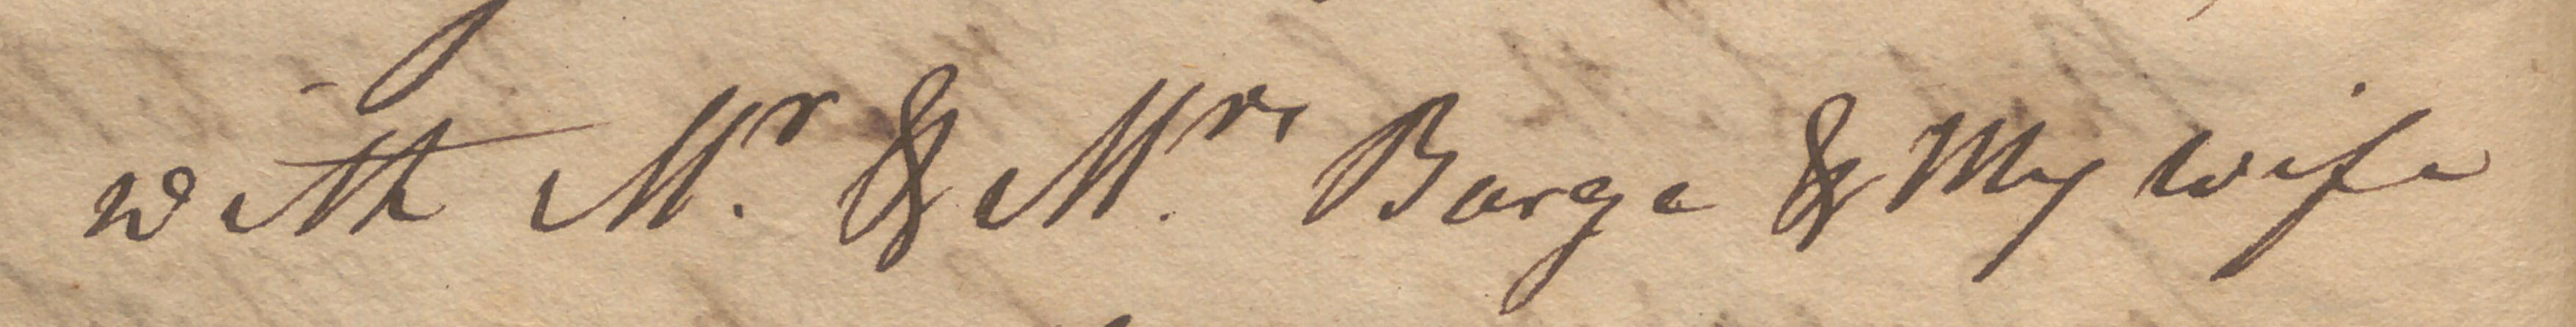with M^r. & M^rs. Barge & My wife
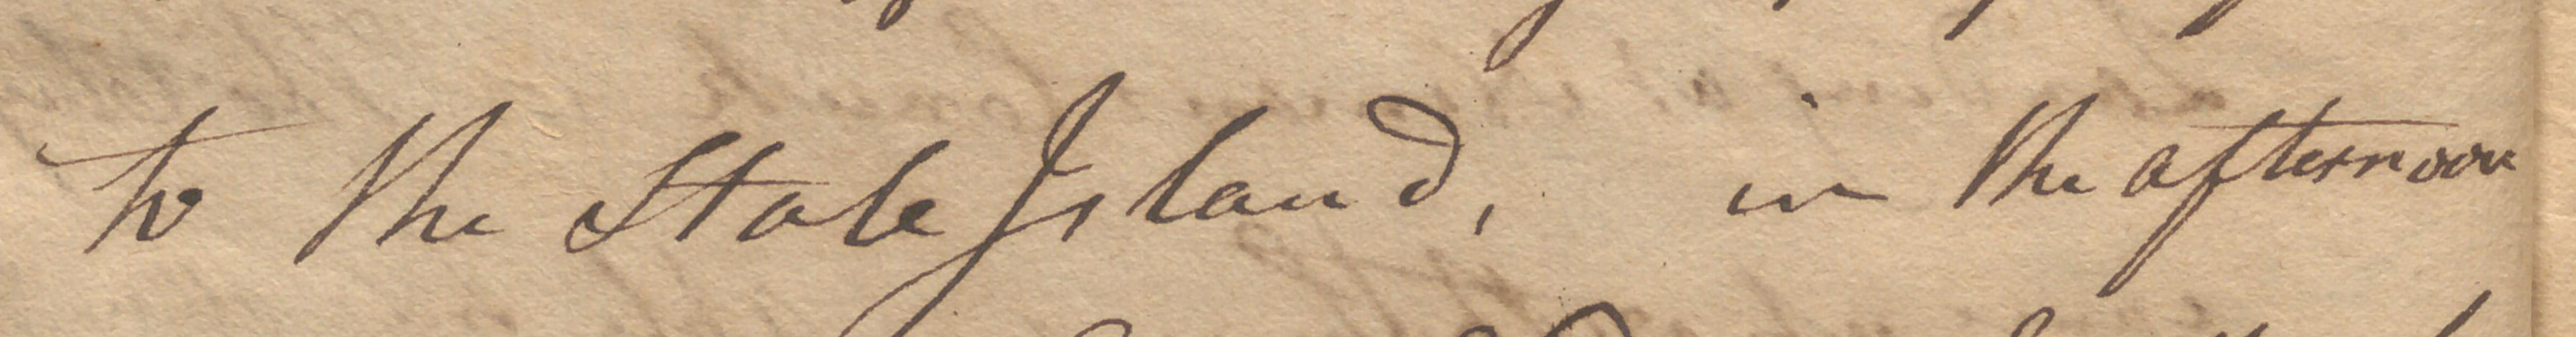to the State Island, in the afternoon
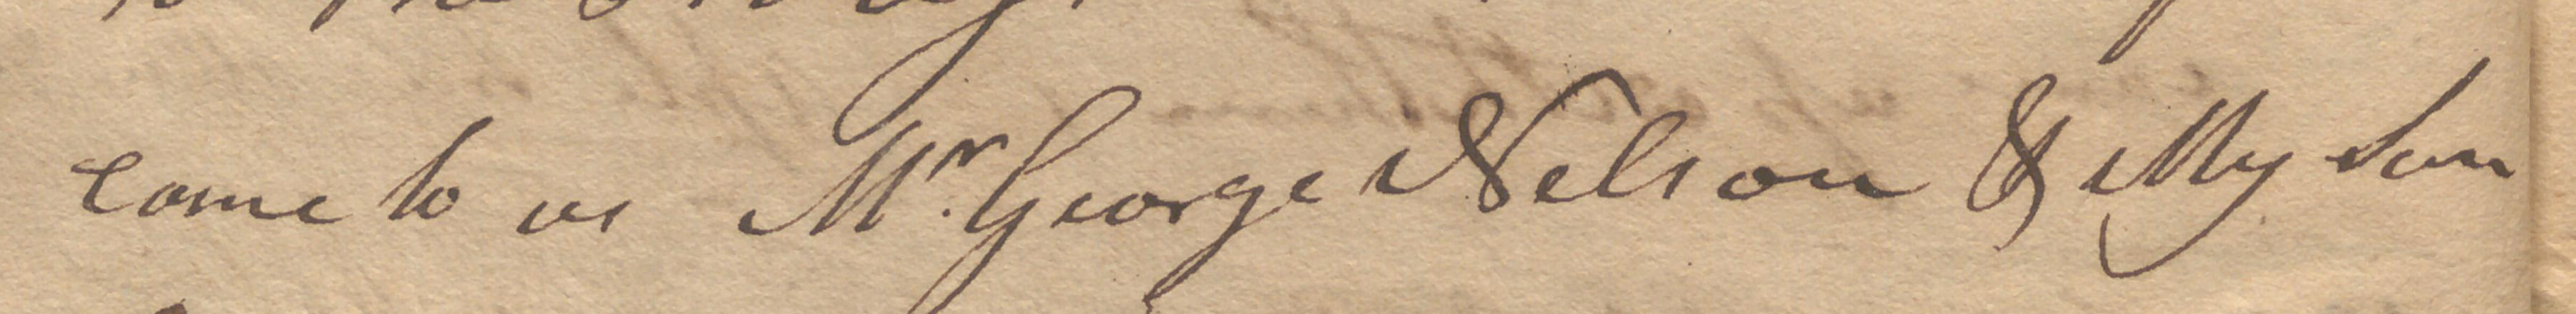come to as M^r George Nelson & My Son
